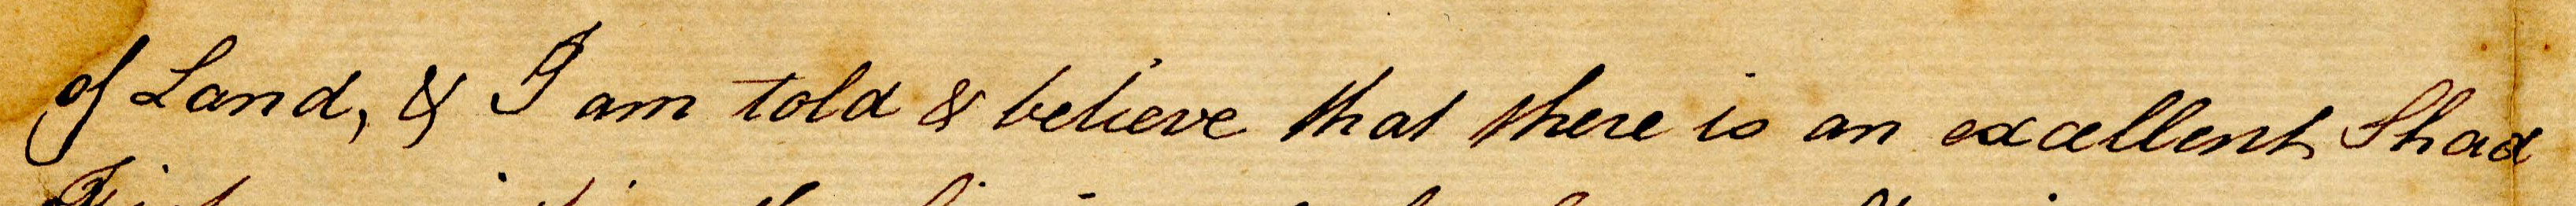of Land, & I am told & believe that there is an excellent Shad
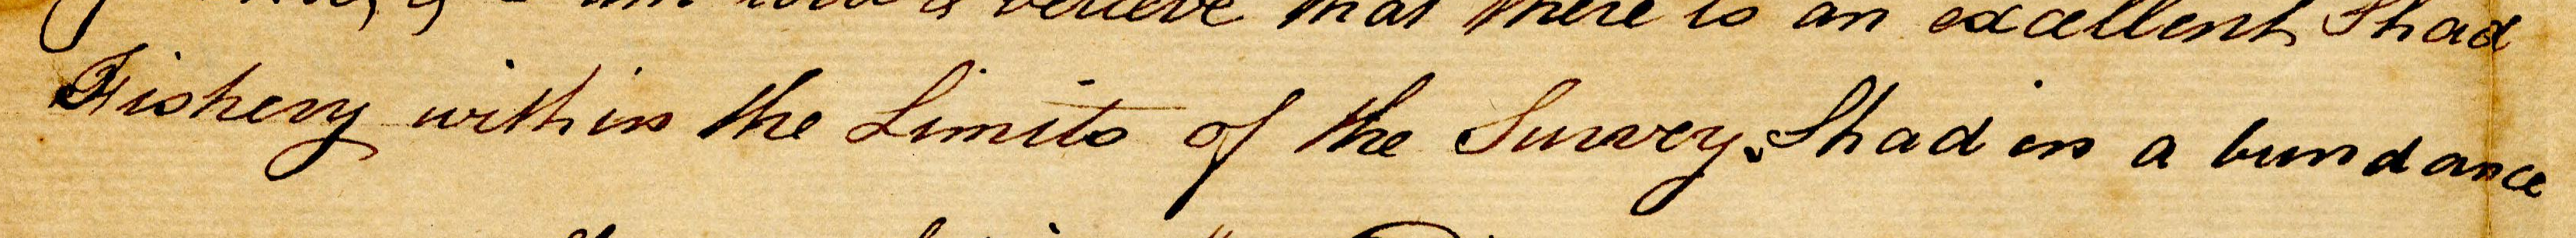Fishery within the Limits of the Survey. Shad in abundance
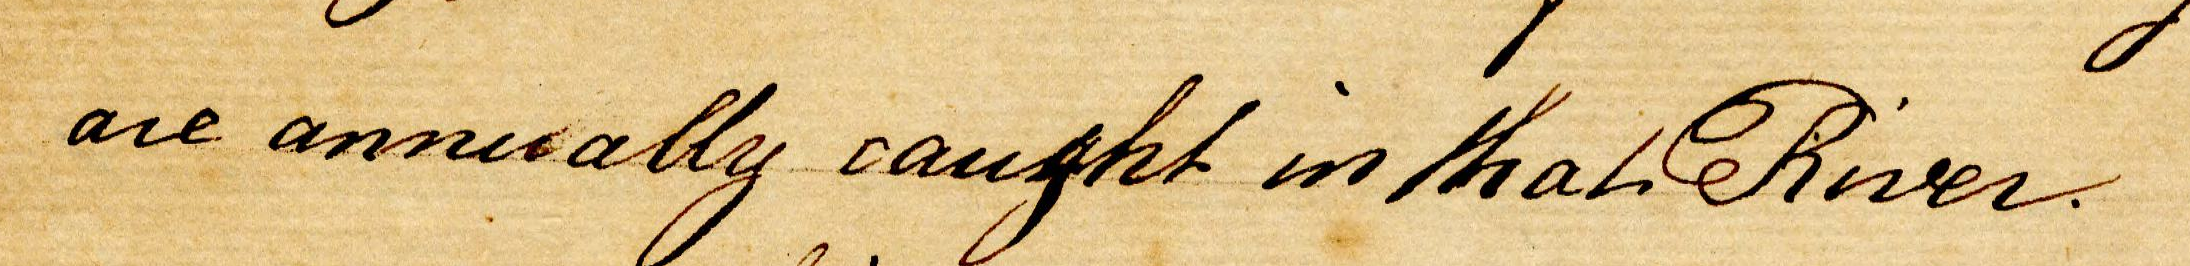are annually caught in that River.
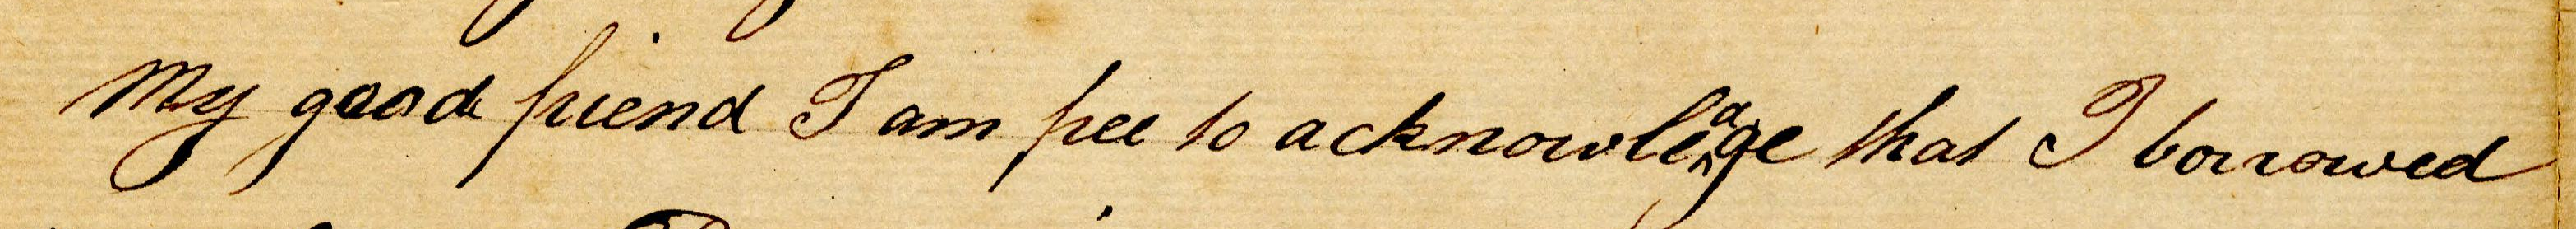My good friend I am free to acknowledge that I borrowed
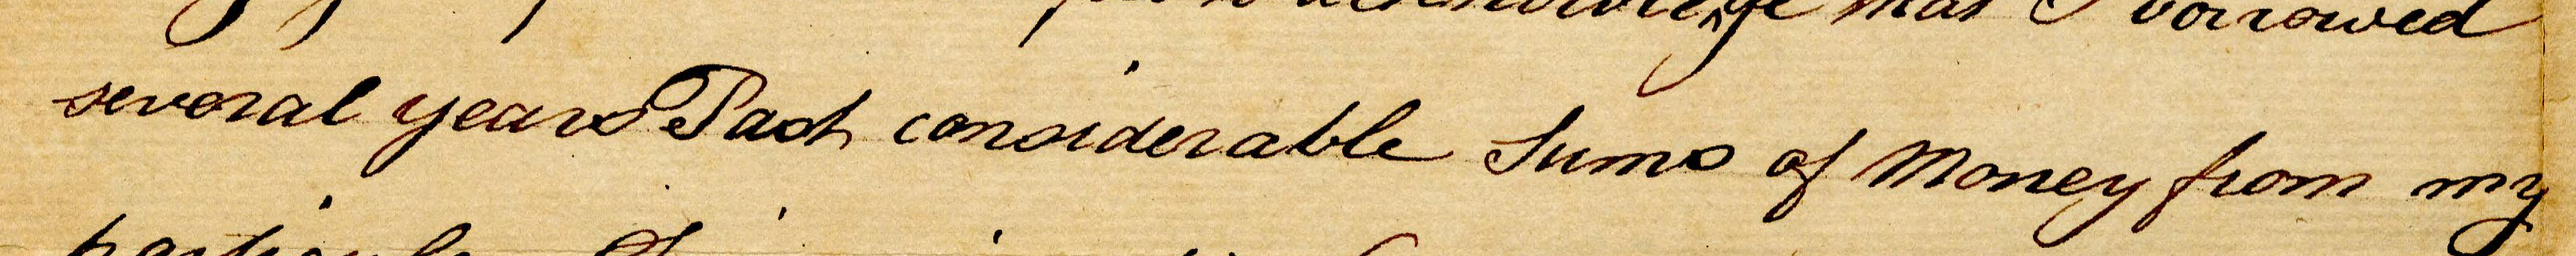several years Past considerable sums of money from my
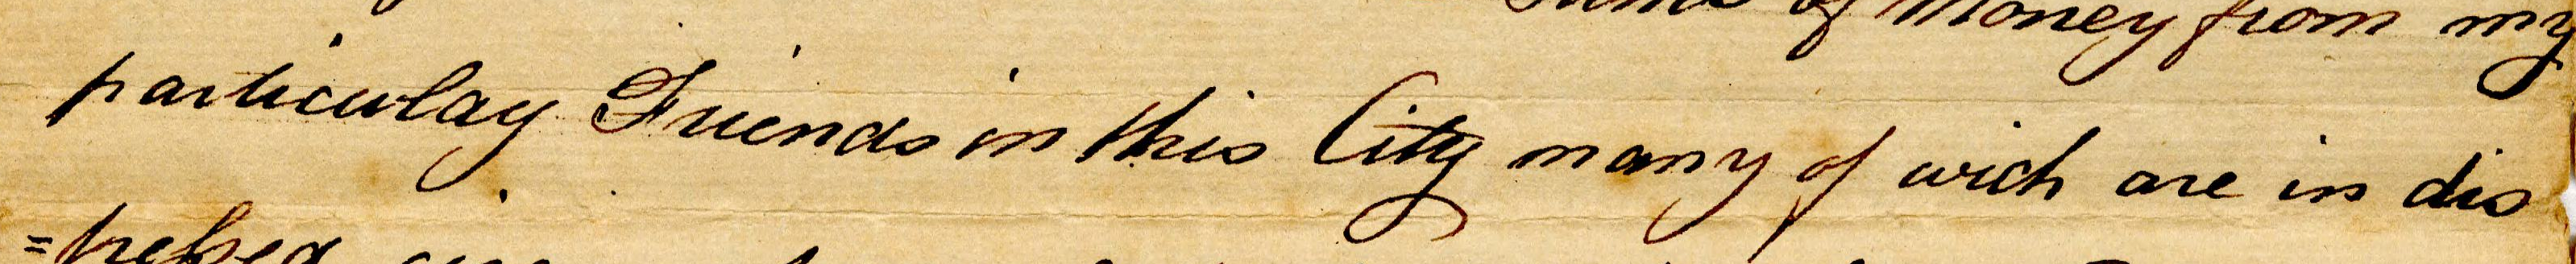particulay Friends in this City many of wich are in dis
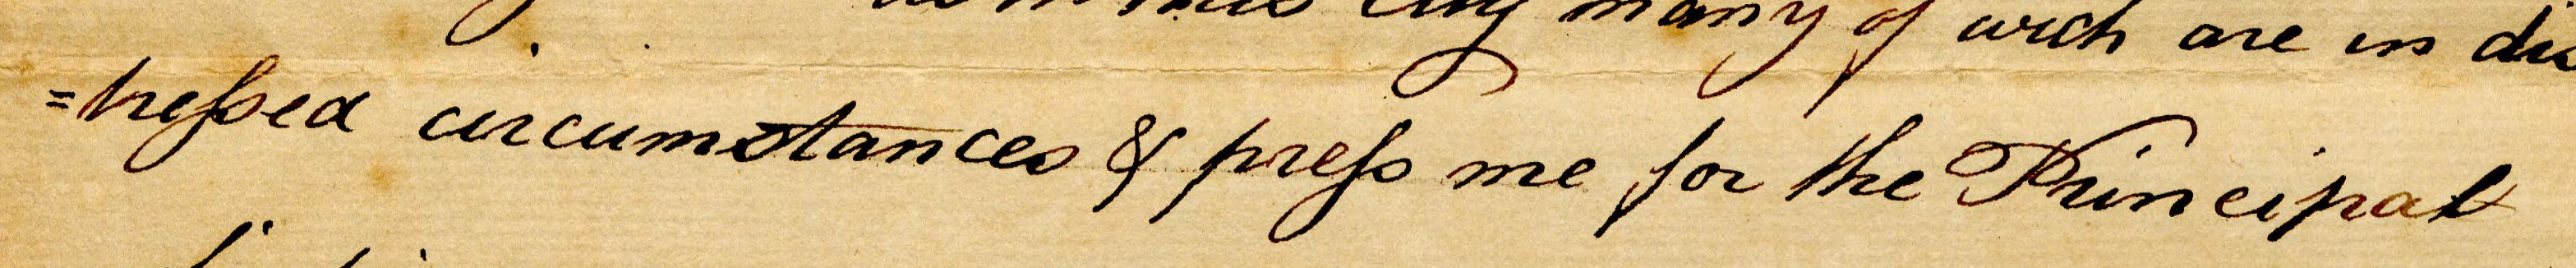-tressed circumstances & press me for the Principal
